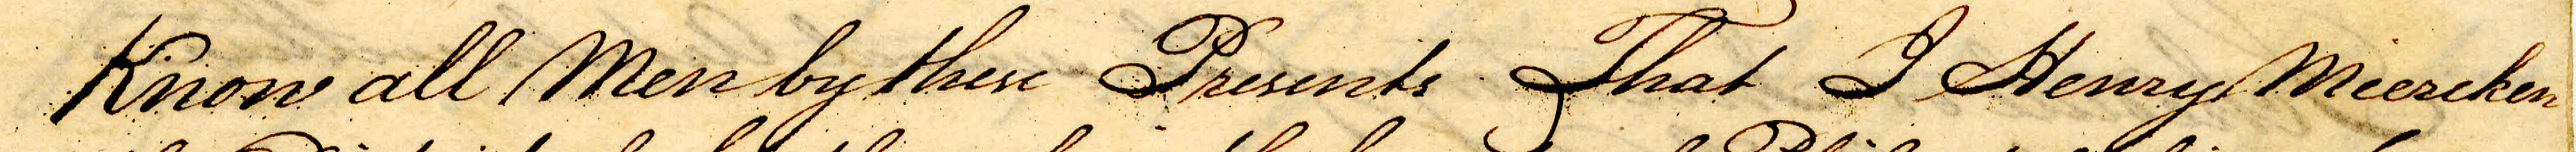Know all men by these Presents That I Henry Miercken
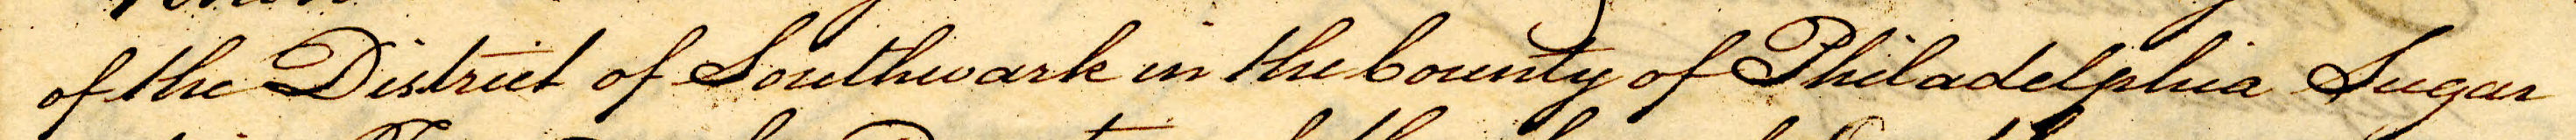of the District of Southwark in the County of Philadelphia Sugar
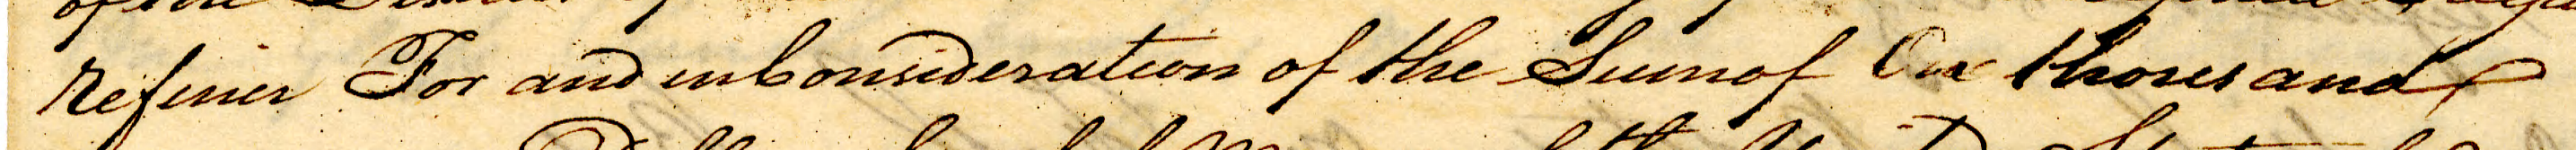refiner For and in Consideration of the sum of One thousand
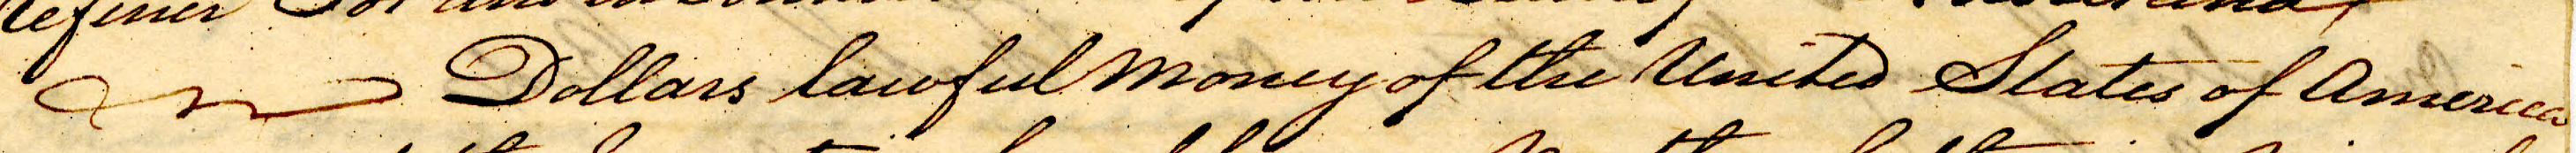-Dollars lawful money of the United States of America
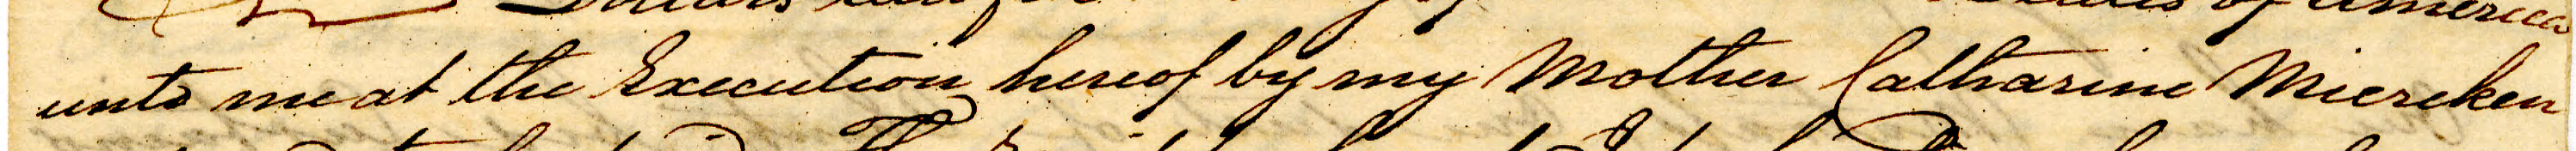unto me at the Executors hereof by my Mother Catharine Miercken
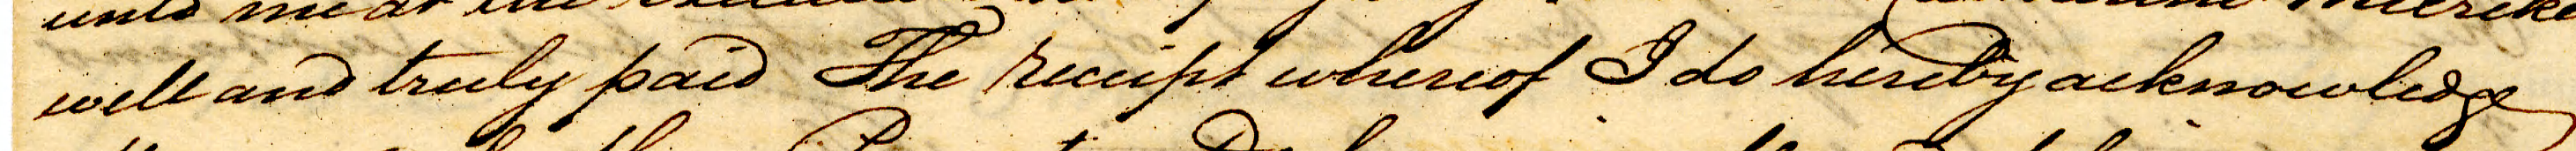will and truly paid The receipt whereof I do hereby acknowledge
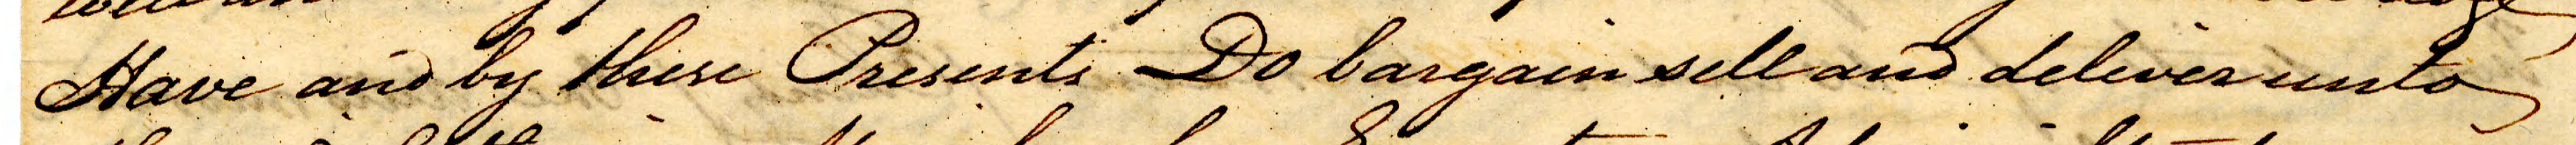Have and by these Presents Do bargain sell and deliver unto
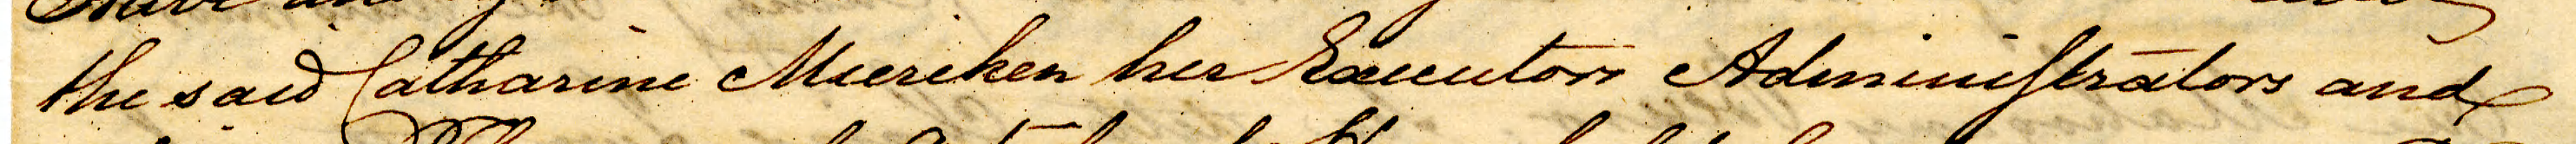the said Catharine Miercken her Executor Administrators and
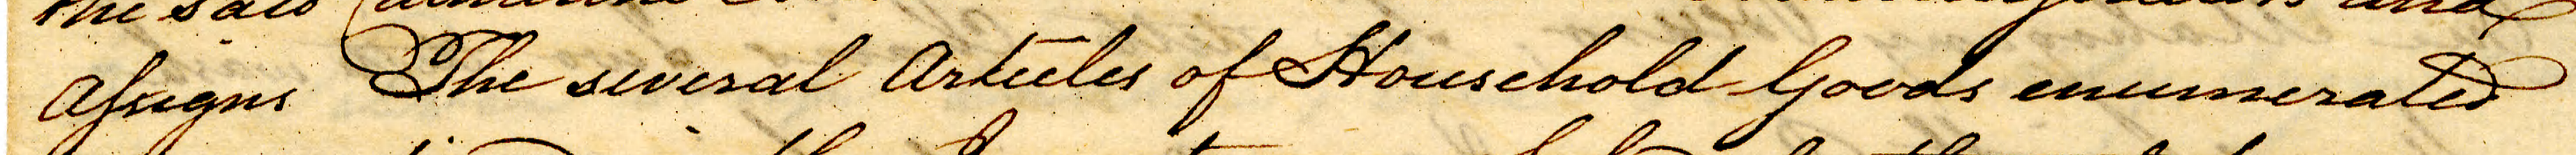assigns The several articles of Household Goods enumerated
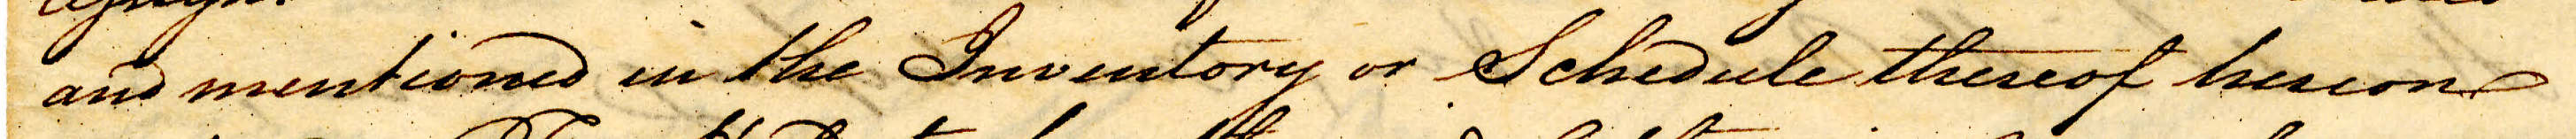and mentioned in the Inventory or Schedule thereof hereon
